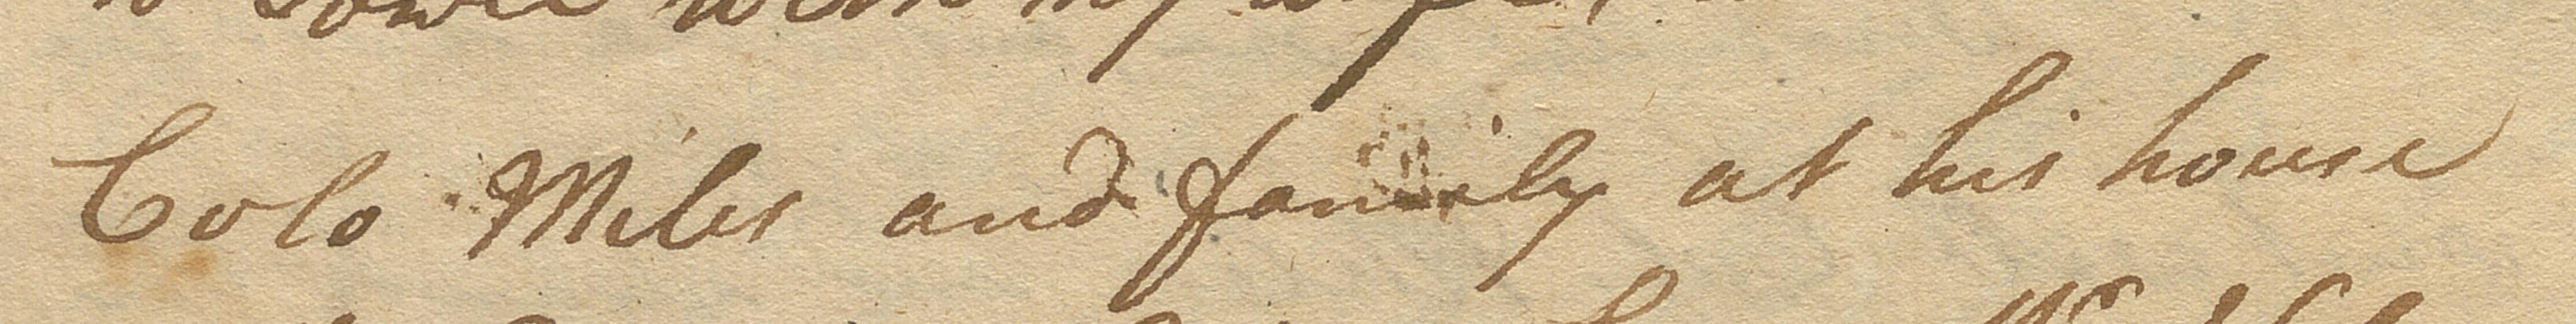Colo Miles and family at his house
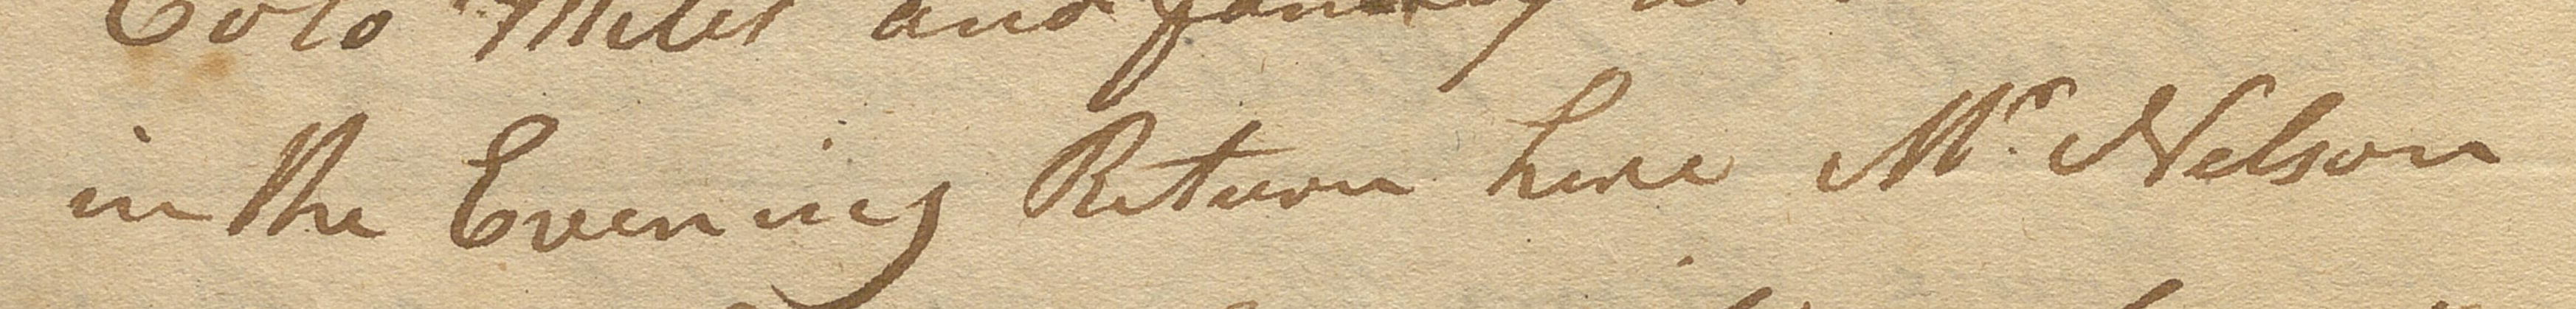in the Evening Return here M^r. Nelson
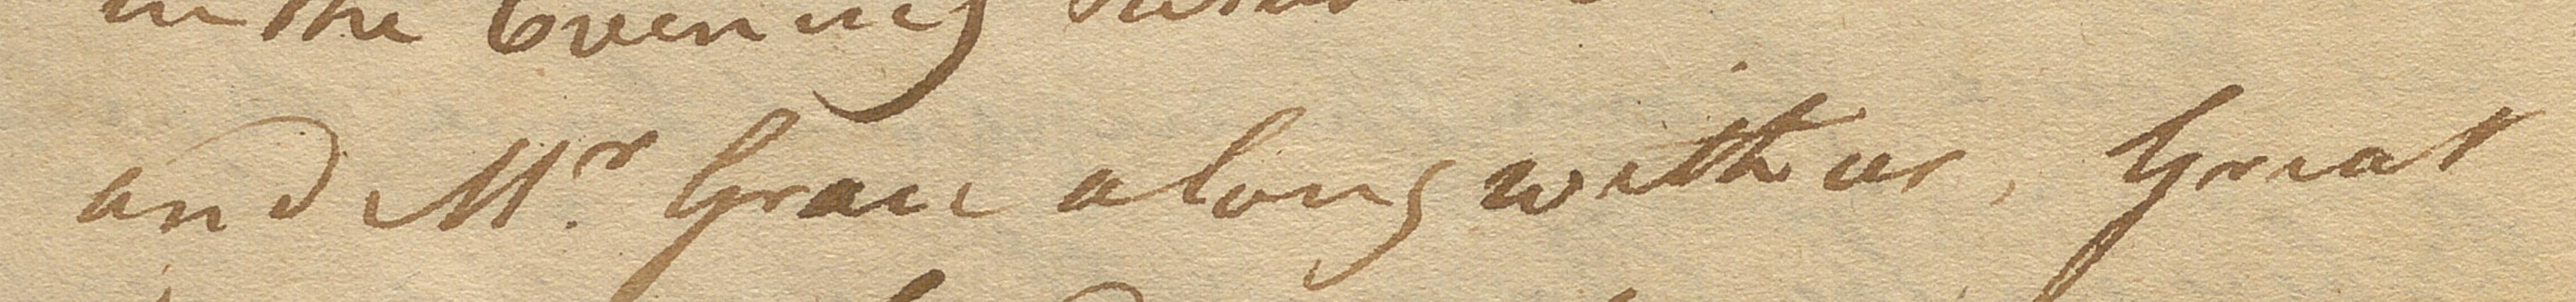and M^r. Grau along with us, Great
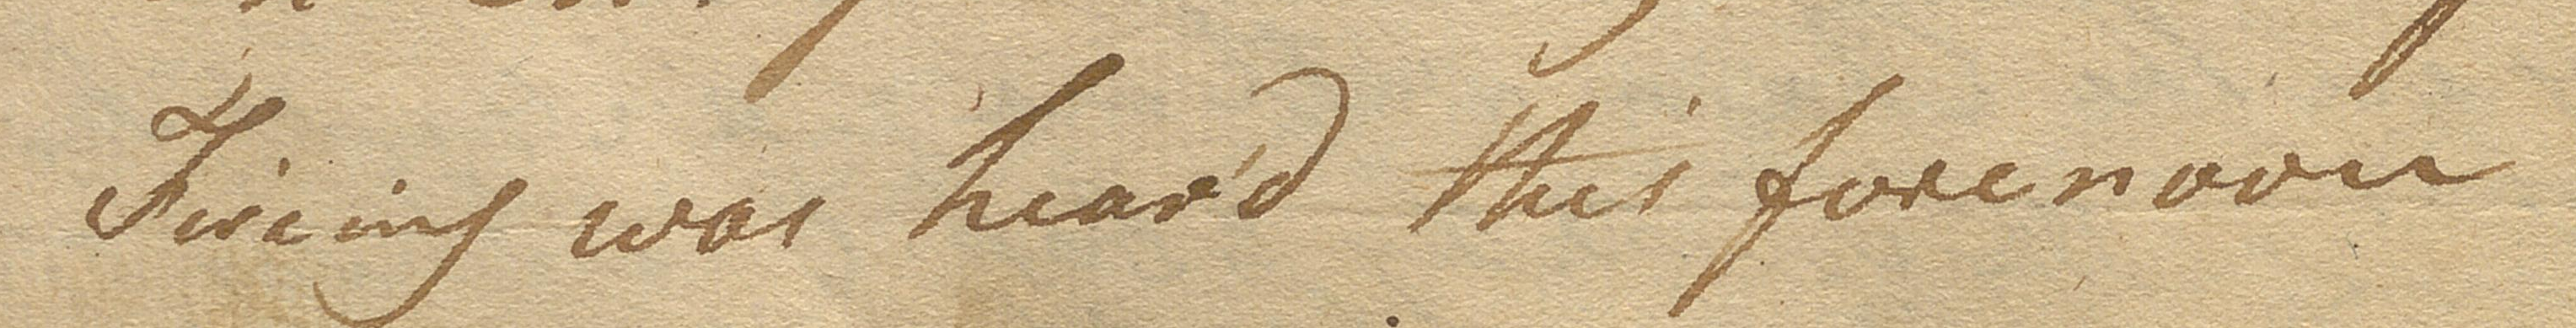Fireing was hear'd this forenoon
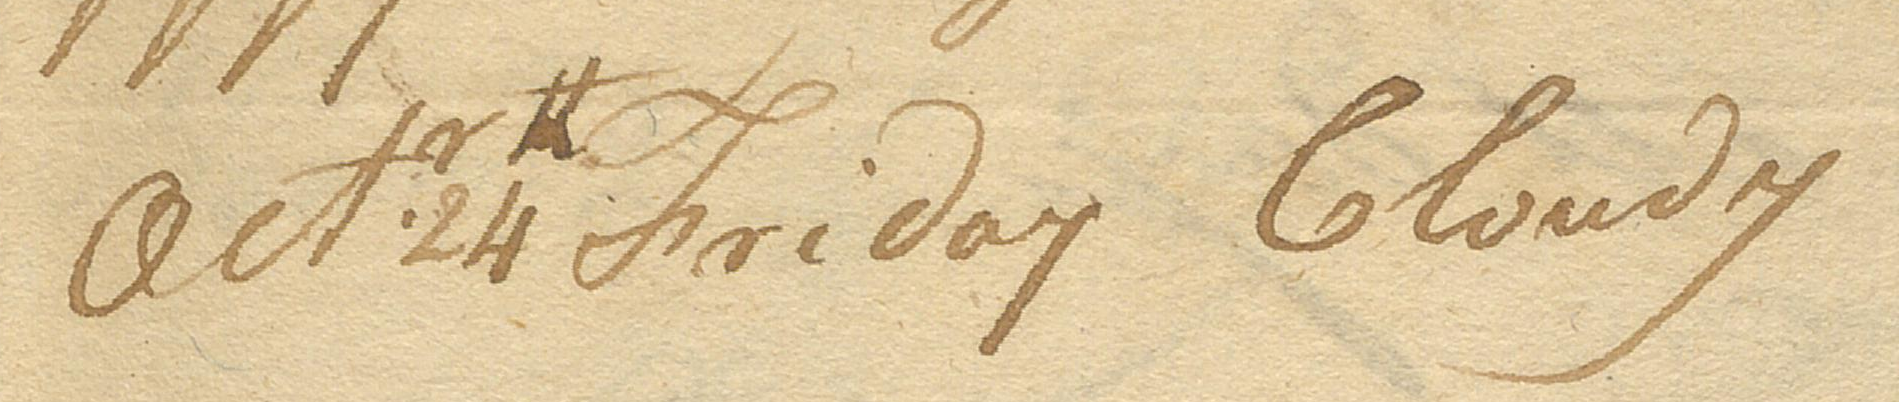Oct^r. 24^th Friday Cloudy
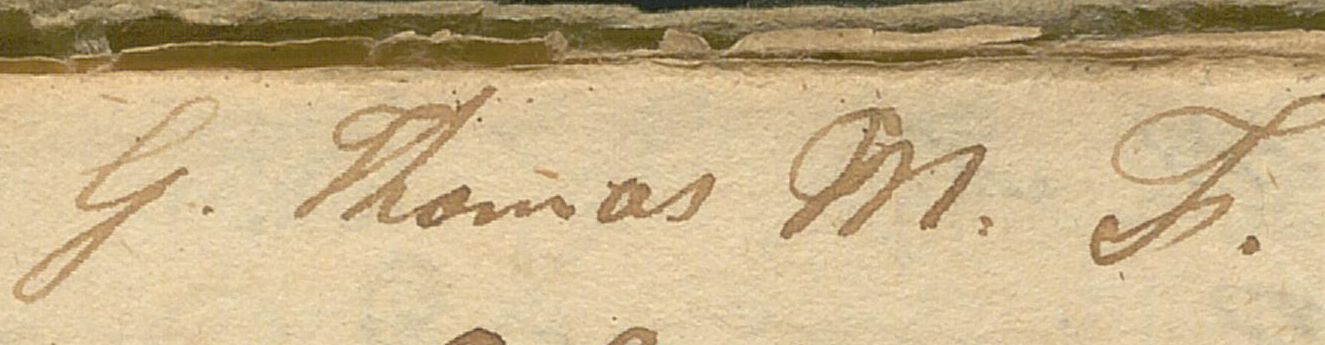G. Thomas M. F.
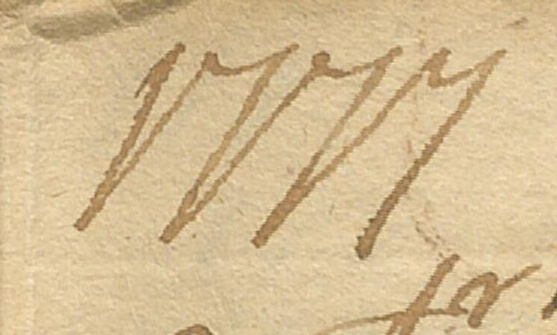1777
